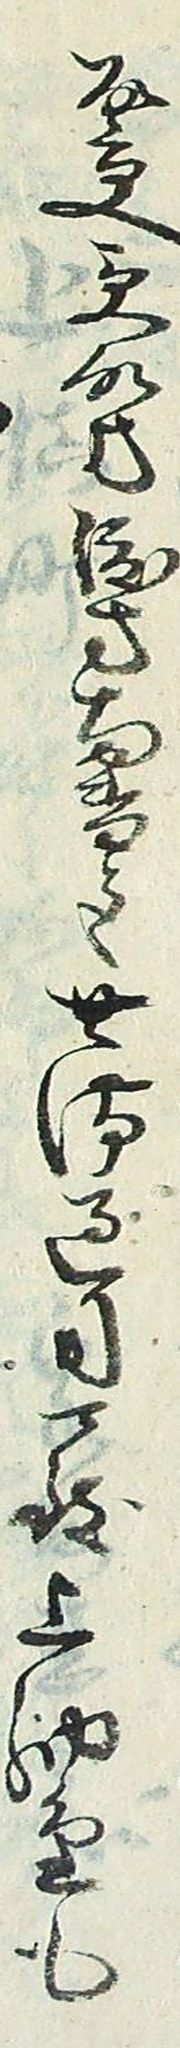取交受取方渡方両替とも無滞可致通用上納金も
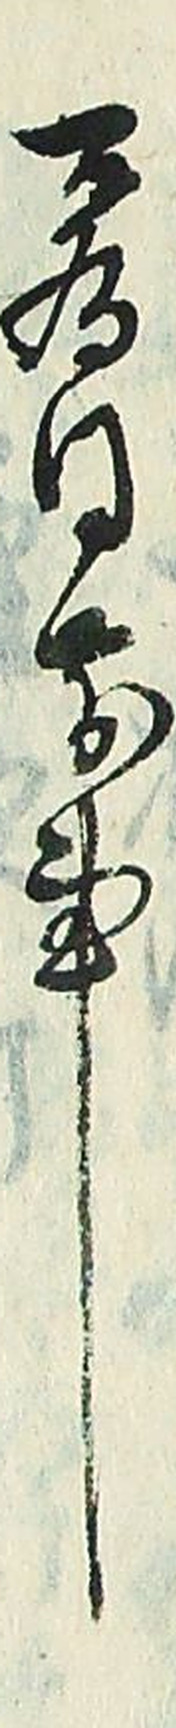可為同前事

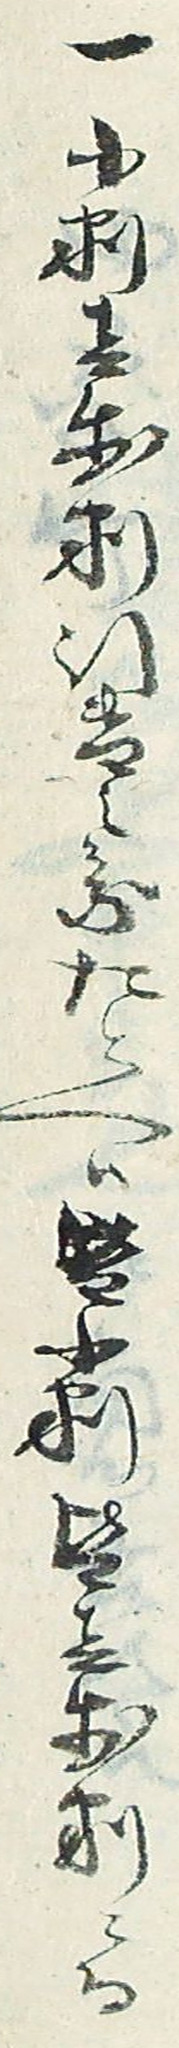小判壱歩判引替之義たとへは替小判皆壱歩判にて
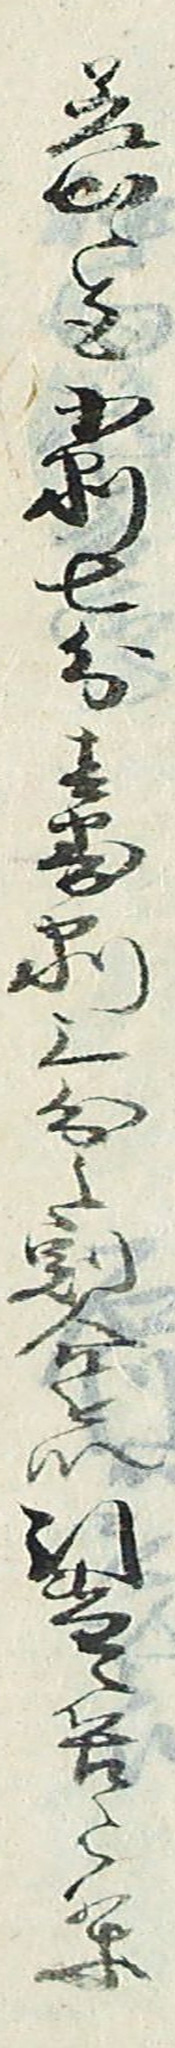差出候とも小判七分壱歩判三分之割合を以引替候筈に候条
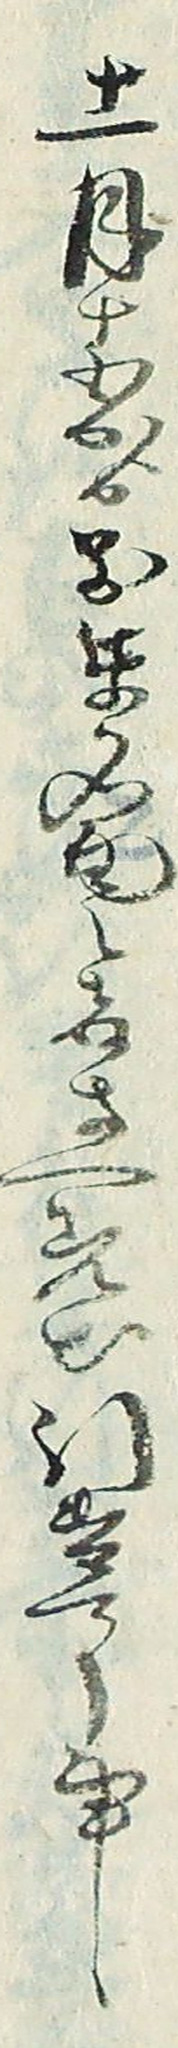十一月十五日ゟ別帋名面之者方へ差出引替可申事
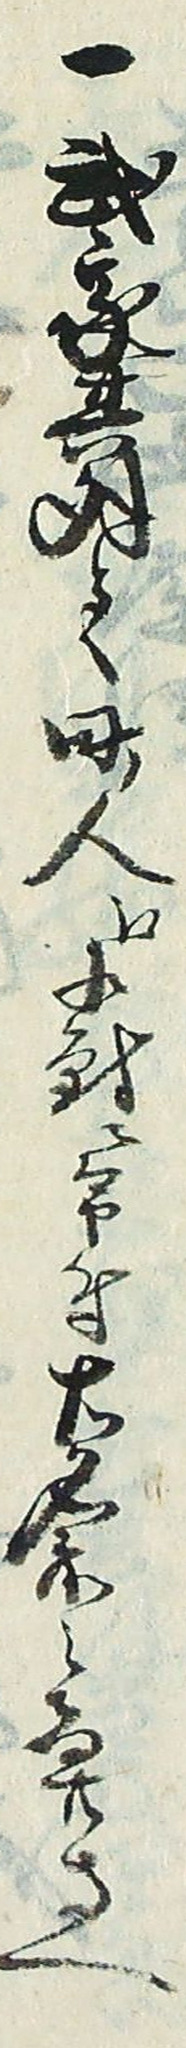一武家其外とも町人江相対にて申付右名前之者共方へ
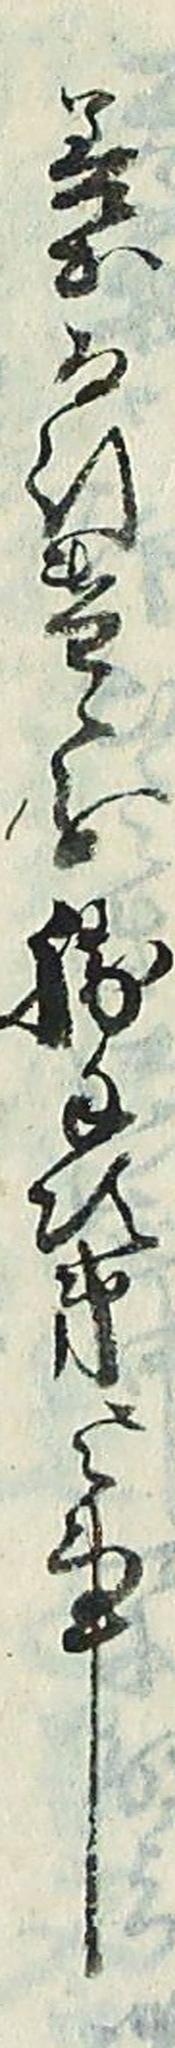差出為引替候義勝手次第に候事
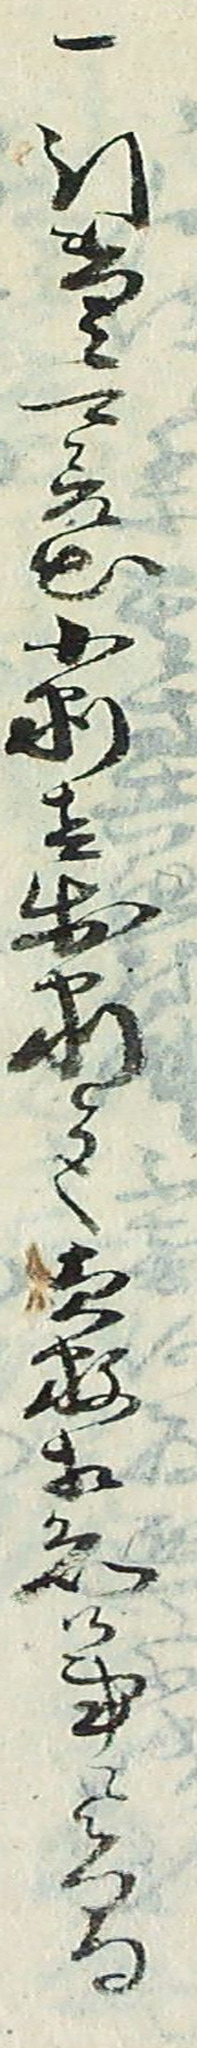一引替に可差出小判壱歩判とも員数相知候事に候間
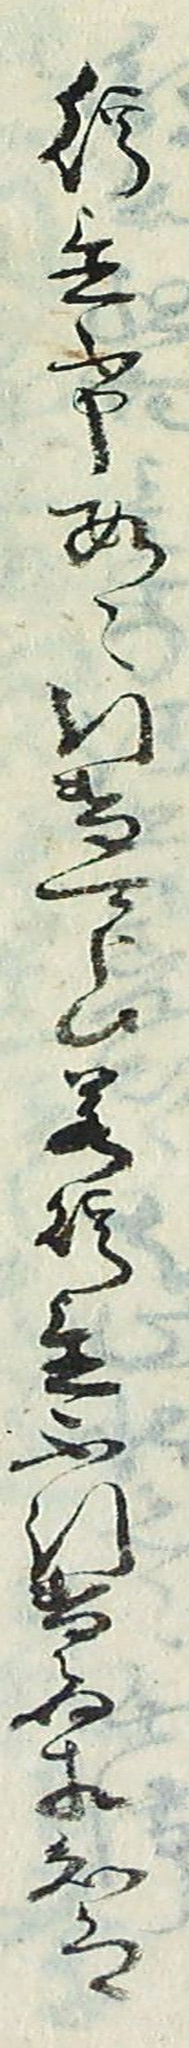貯置不申段々引替可申候若貯置不引替者相知候はゝ
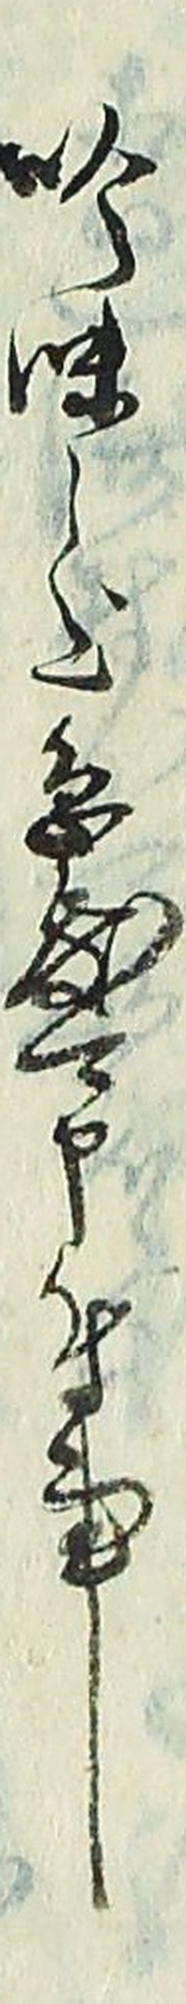吟味之上急度可申付事
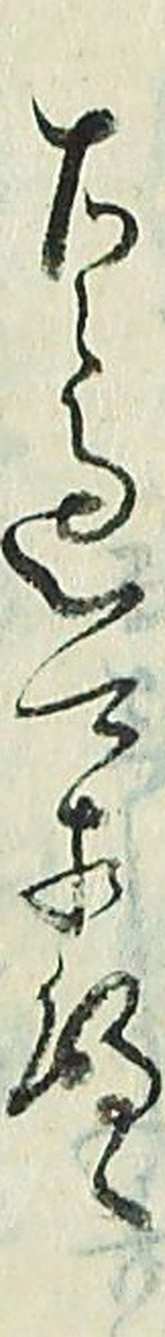右之通可相触候
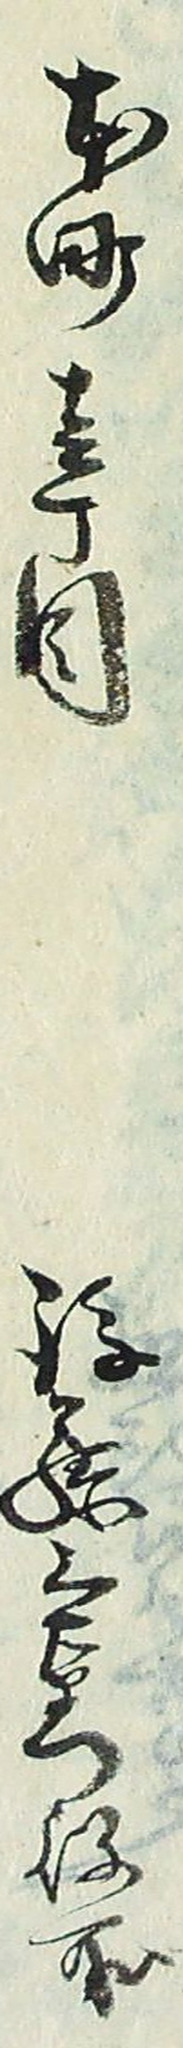本町壱丁目後藤三右衛門役所
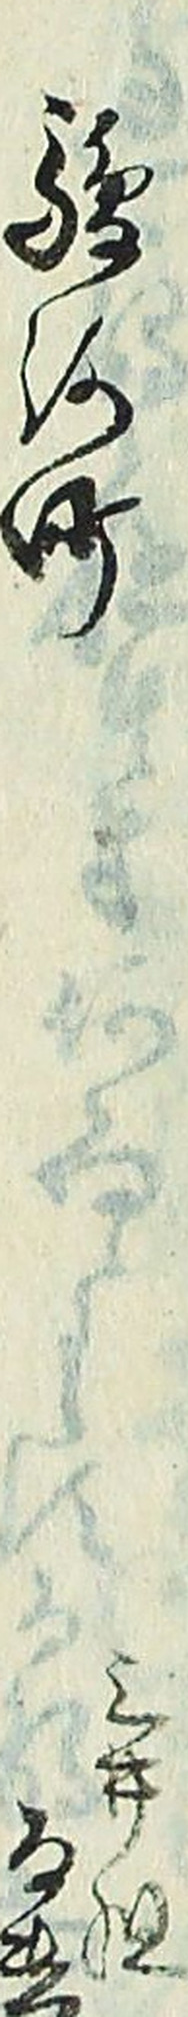駿河町三井組
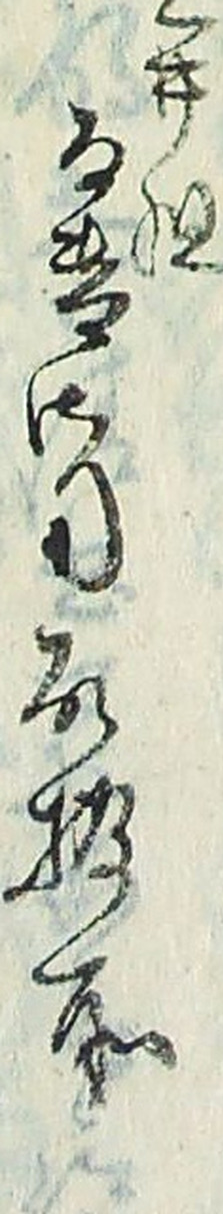為替御用取扱所
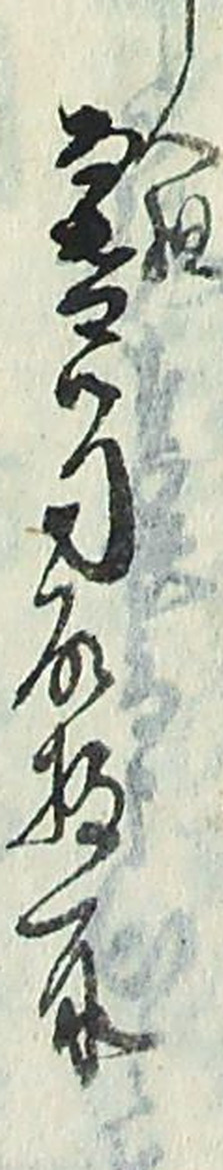為替御用取扱所
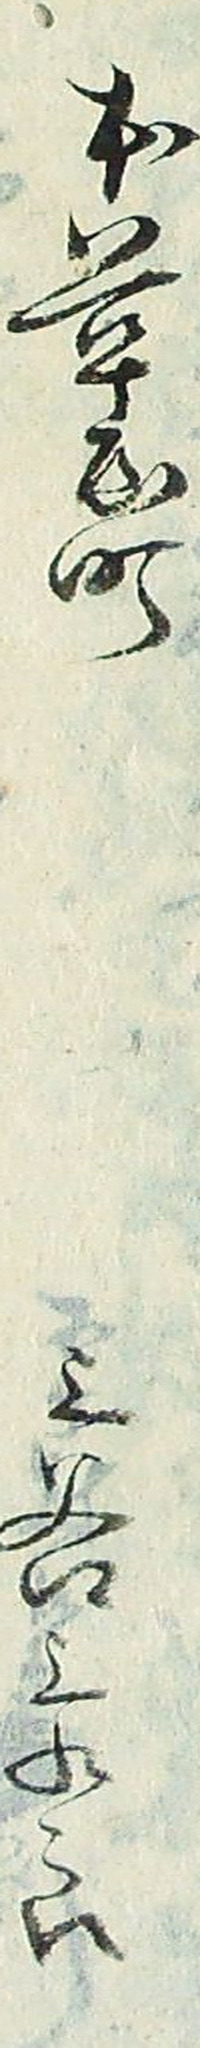本革屋町三谷三九郎
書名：諸御用御□受書控
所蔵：鳴門教育大学 Naruto University of Education
